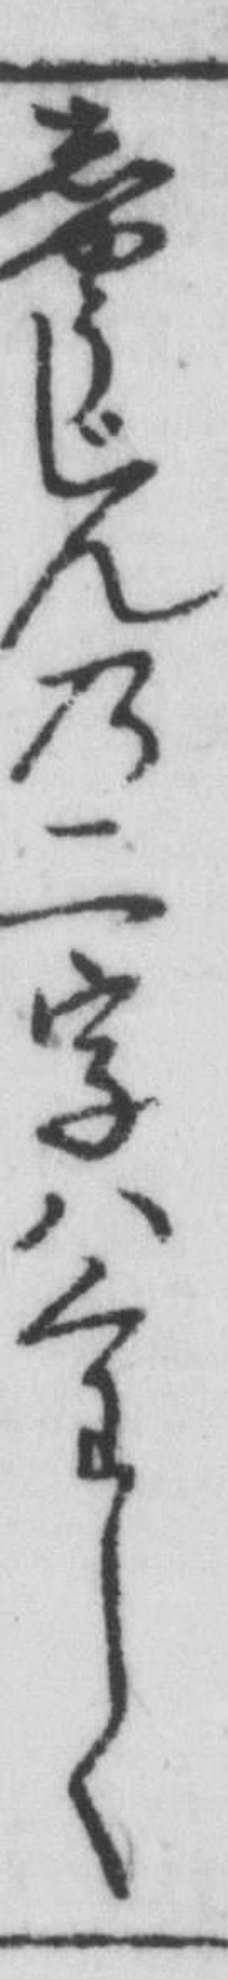しようじんの二字ハくわしく
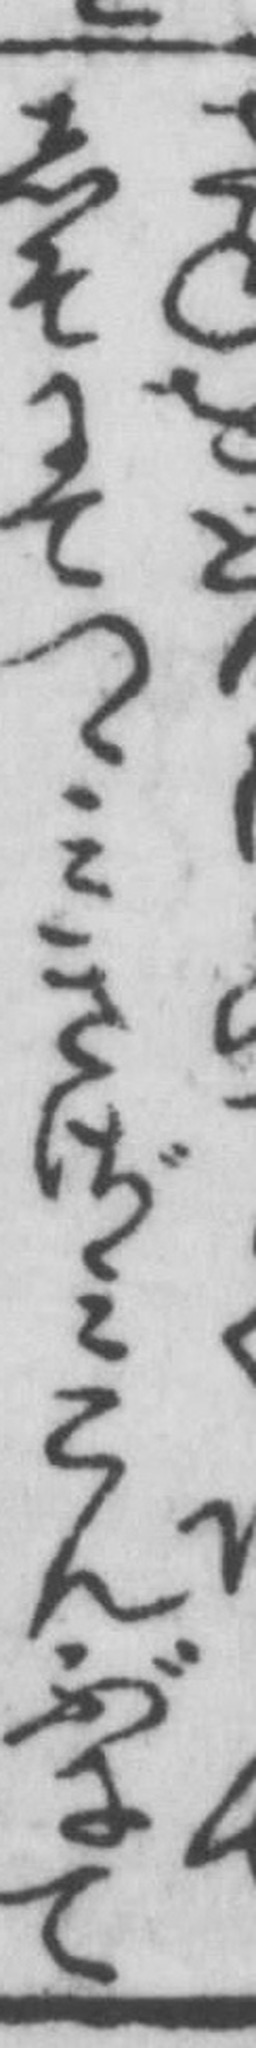しそにてつゝミきミこんぶにて
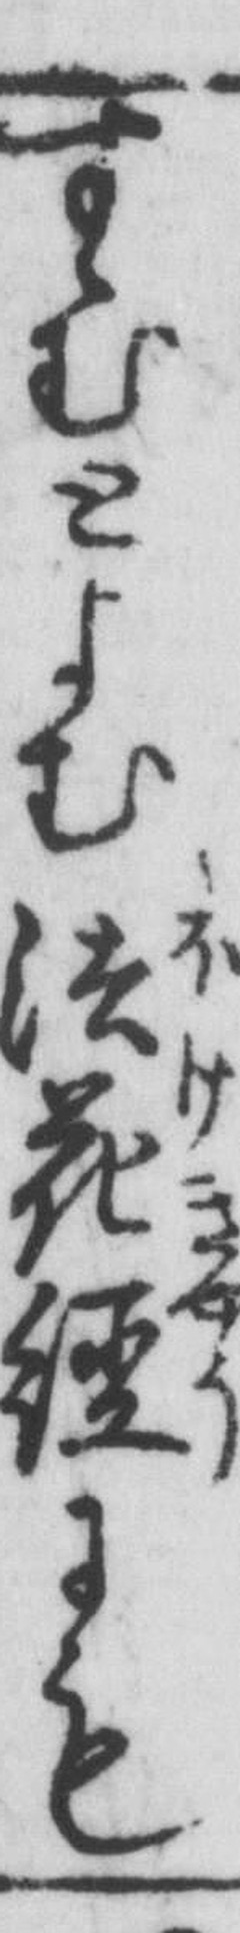すゝむとよむ法華経にも
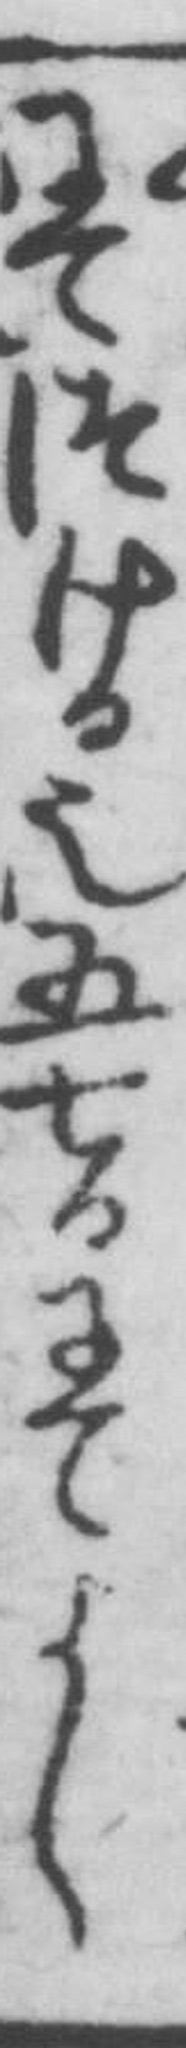てつける也五七にてよし
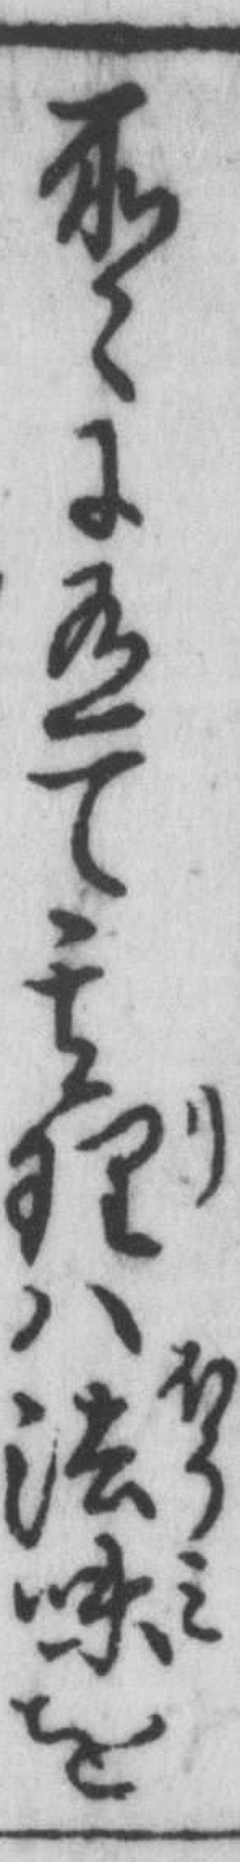取々に有て理ハ法味を
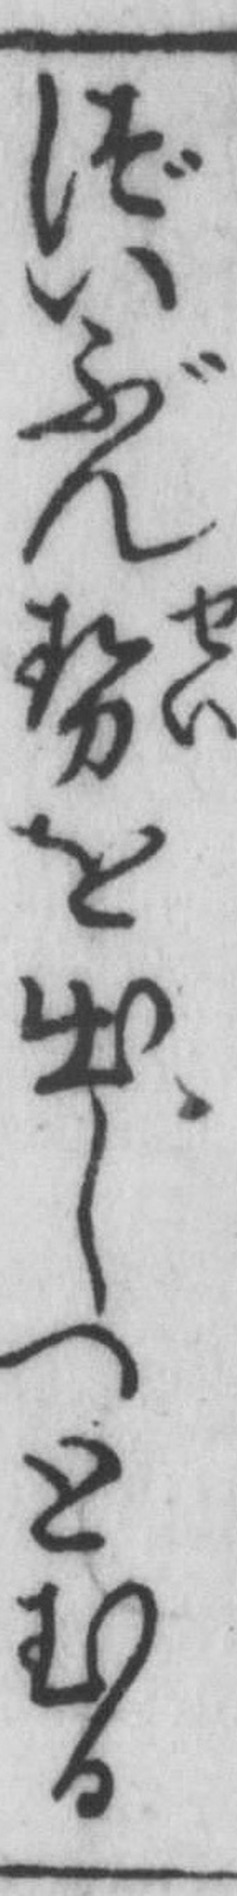ずいぶん勢を出しつとむる
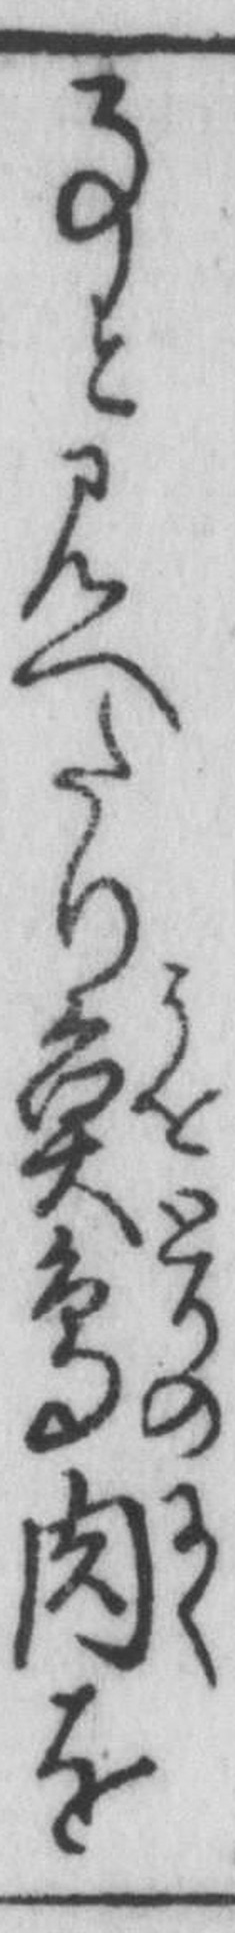なと見えたり魚鳥肉を
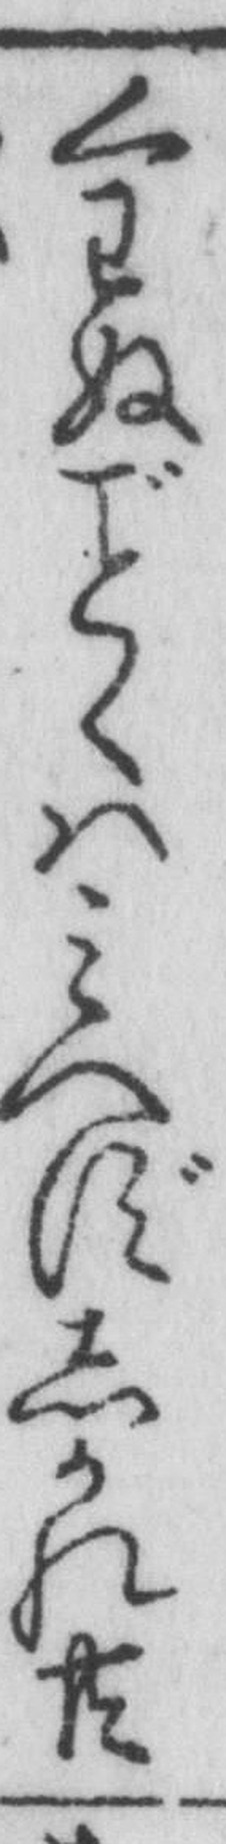くわぬごとくハミへずしかれ
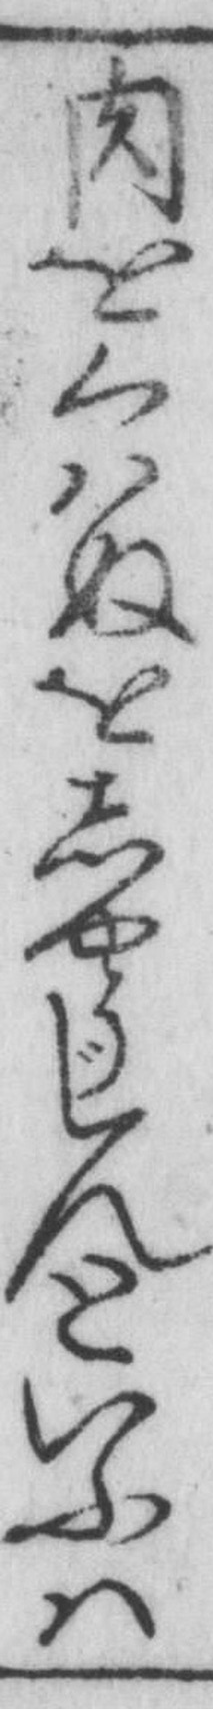肉をくハぬをしやうじんといふハ
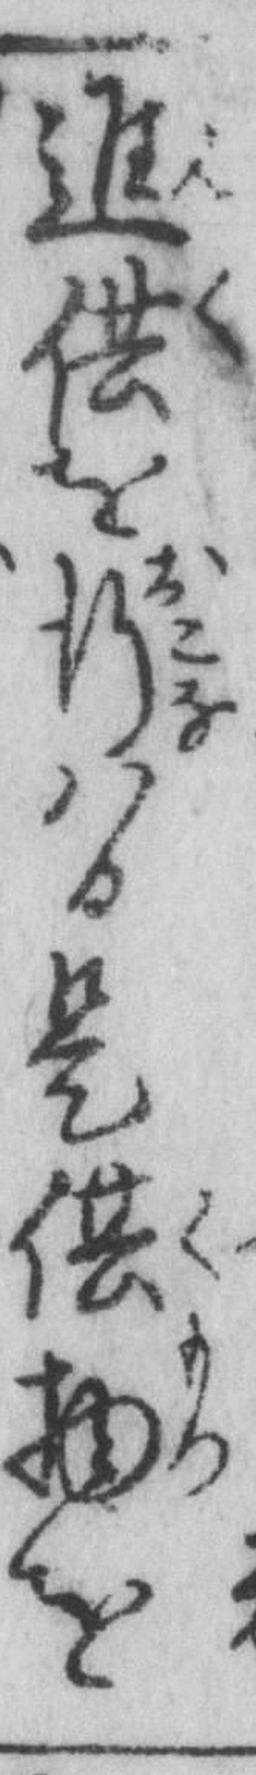進供を行ハる是供物を
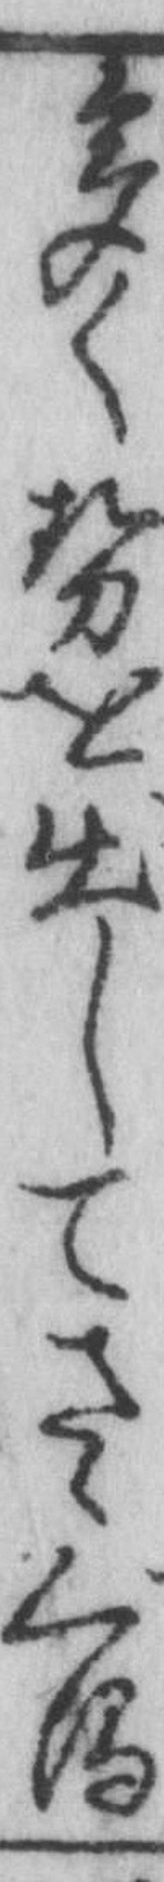多く勢を出し葉てさゝぐ
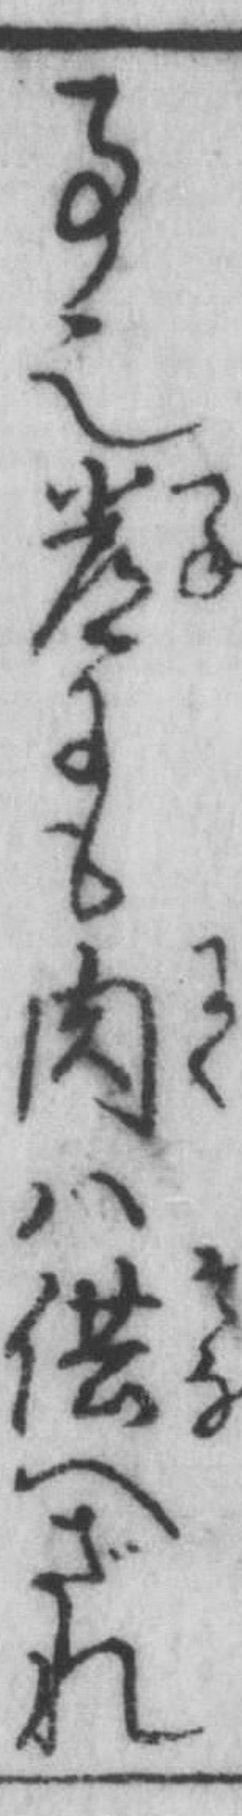事也常にも肉ハ供へざれ
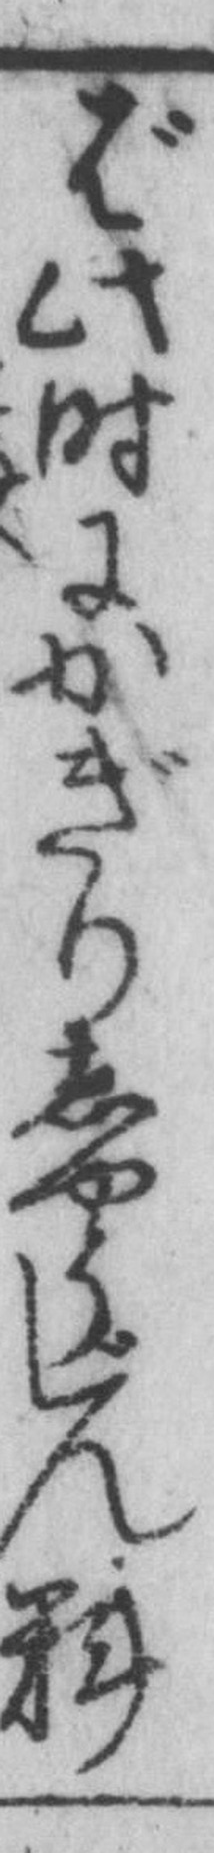ば此の時にかぎりしやうじん料
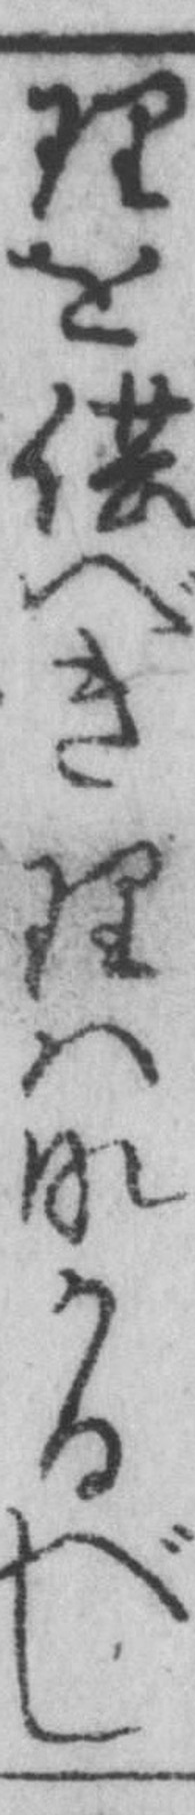理を供るべき理ハなかるべし
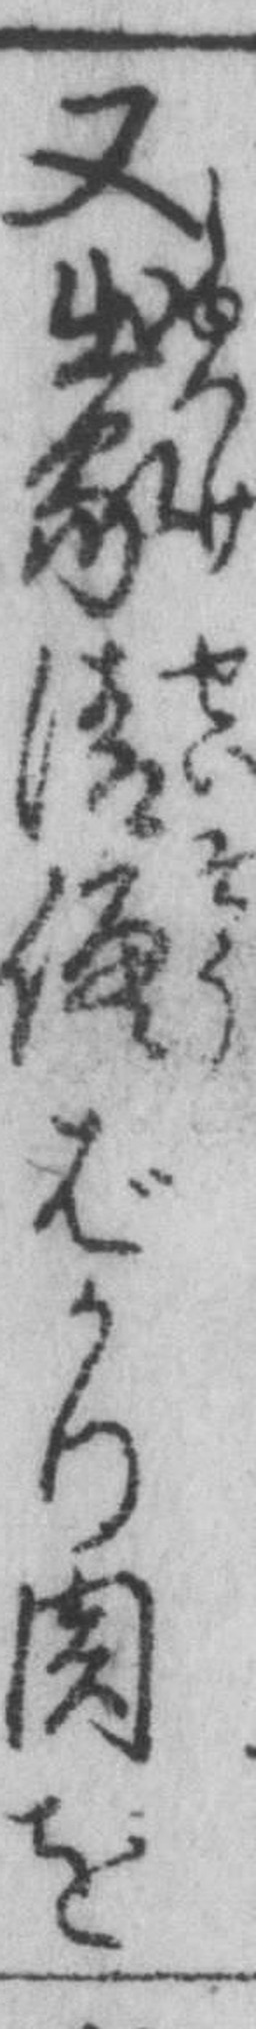又出家清浄ばかり肉を
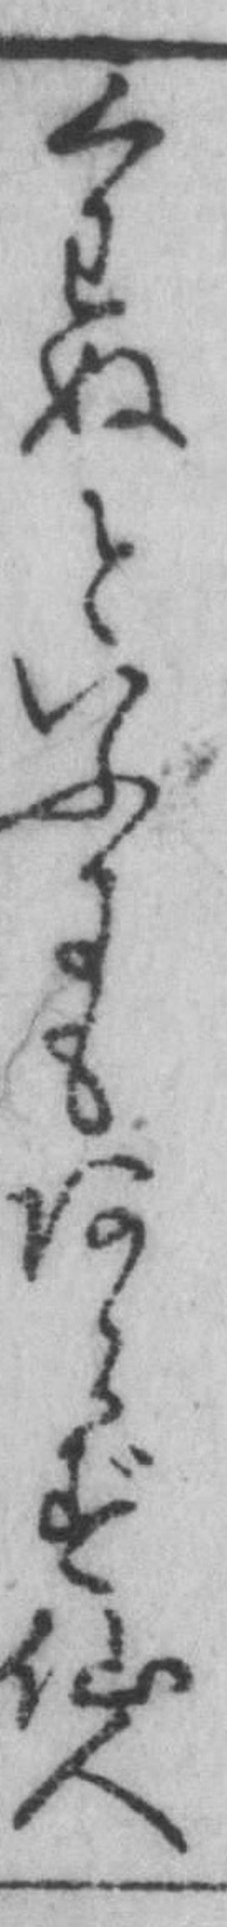くわぬというにもあらず仙人
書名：料理献立抄
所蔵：大阪府立大学学術情報センター 国文学研究資料館
